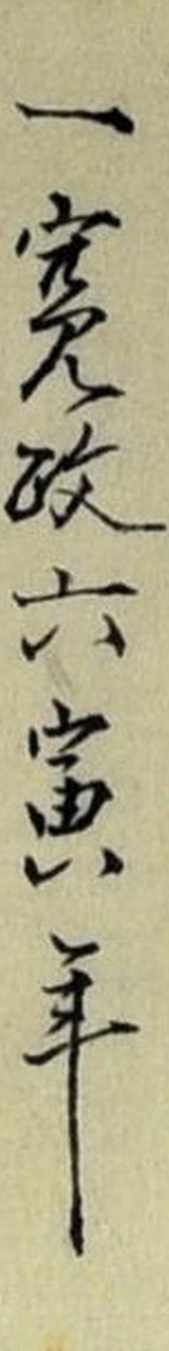一寛政六寅年
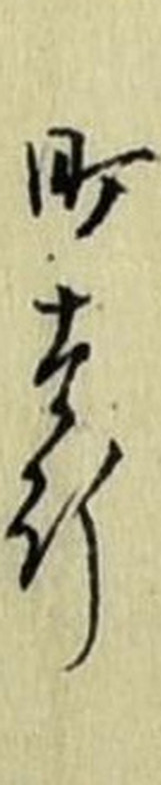町奉行
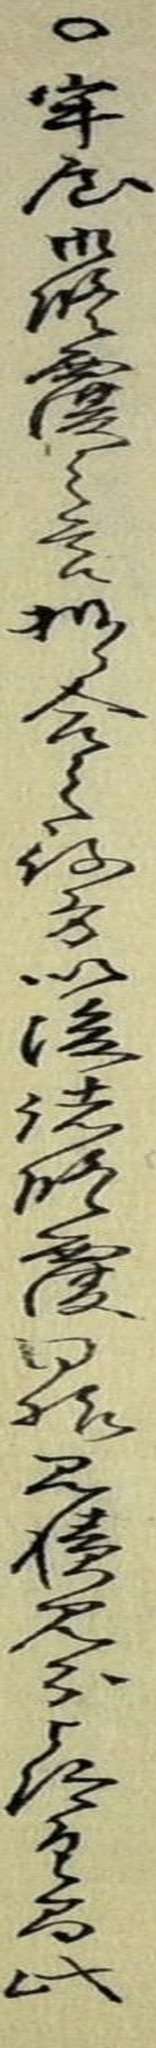〇牢屋御修覆之節掛り合之役方以後諸修覆同様見積見分被仰付候間此
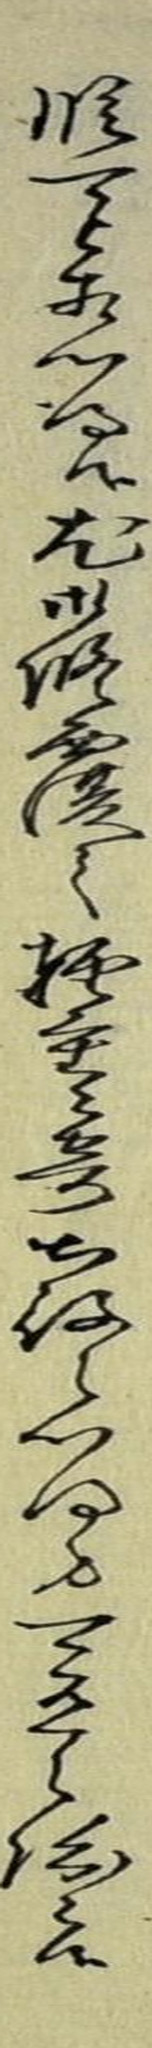段可被相心得候尤御修覆之軽重ニ寄出役之心得方可有之儀ニ候
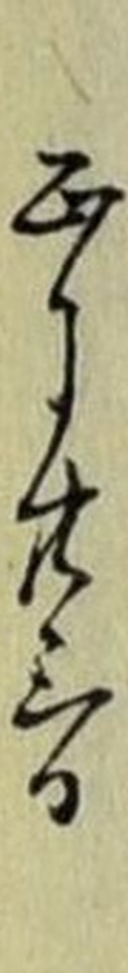正月廿三日
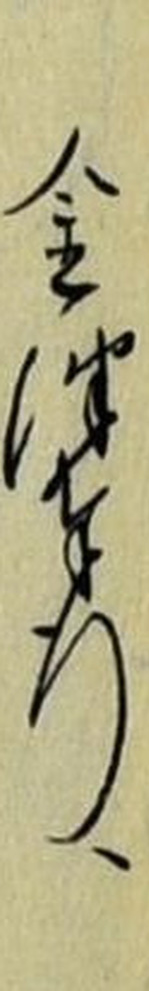金津奉行へ
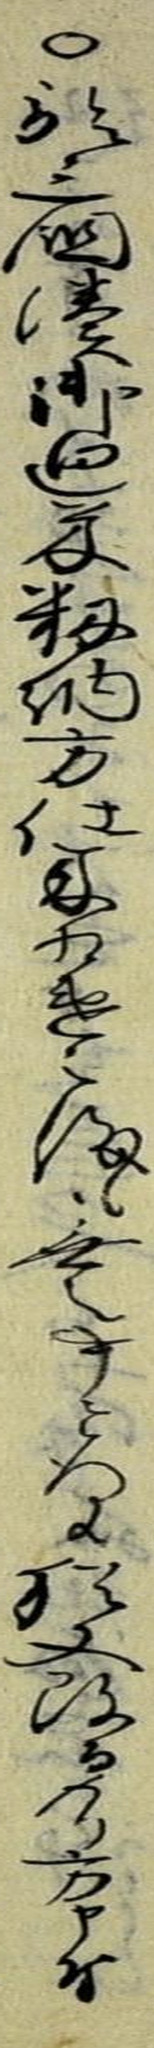〇於三国湊御廻米籾納方仕来相遣之儀も無之事ニ候得共猶又改而〆り方申付
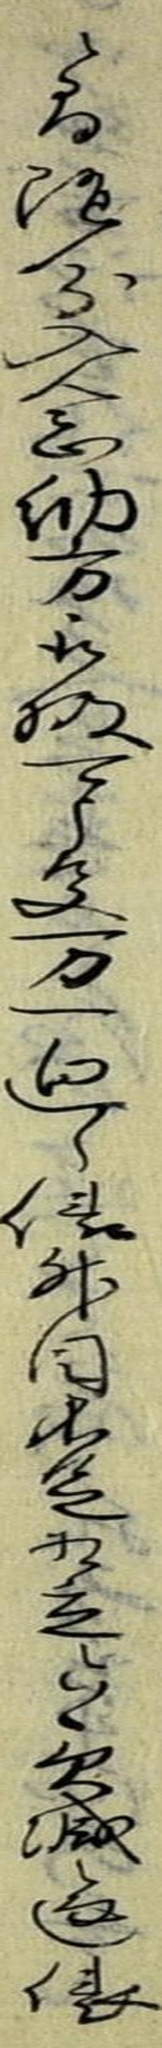候間随分入念納方取扱可申事万一廻し俵升目不足相立候ハヽ欠減之通俵
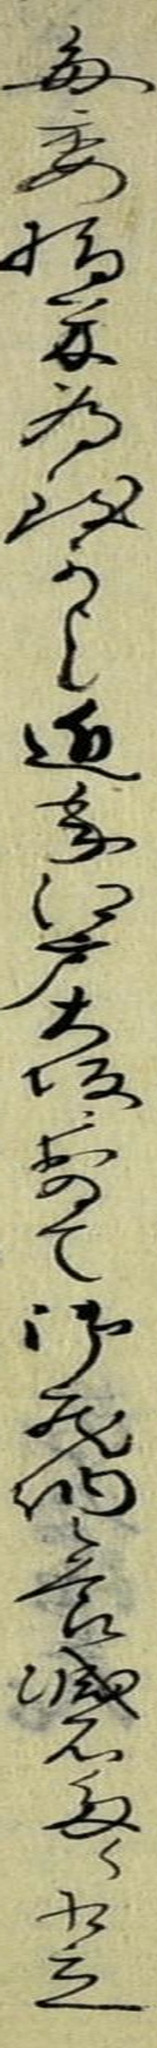毎委指米為致可申候近年江戸大坂ニおゐて御蔵納之節減石多く相立
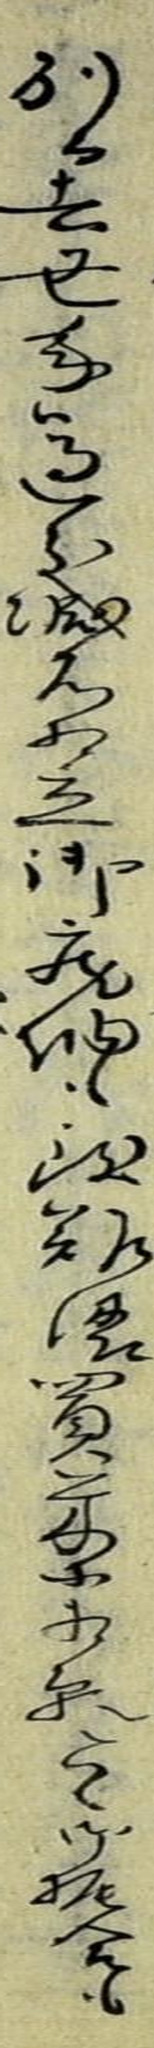別而去丑年ハ過分減石相立御蔵納も致難渋買米等相願候ハヽ御振合も
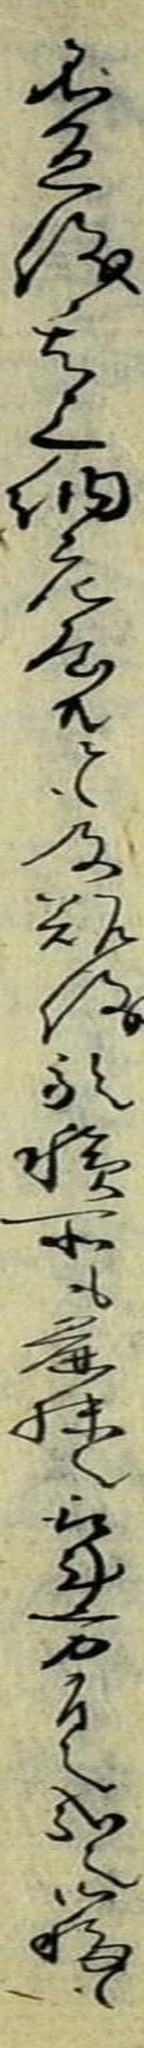不宜儀其上納庄屋共ニも及難儀於積所も麁抹之取計方有之哉之御移も
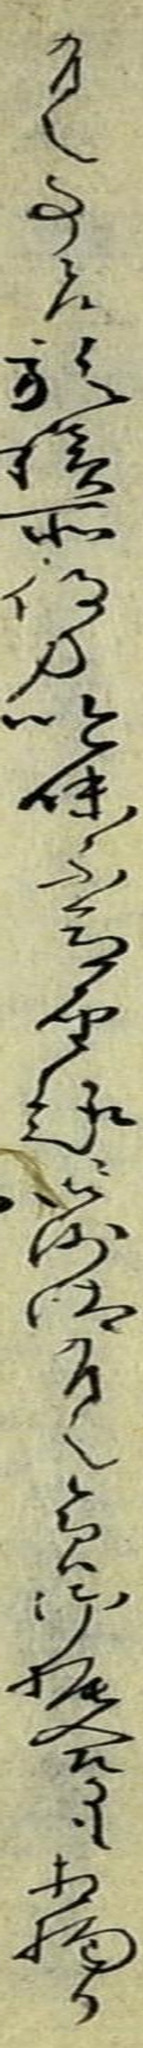有之事ニ候於積所役方吟味不参届趣ニ御沙汰有之候而ハ御振合にも相拘り
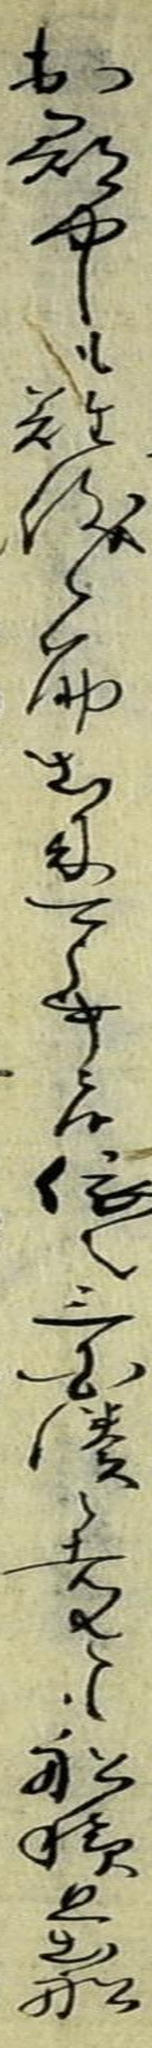於郡中も難儀候筋出来可申事ニ候依之三国湊之者共へも船積且出船
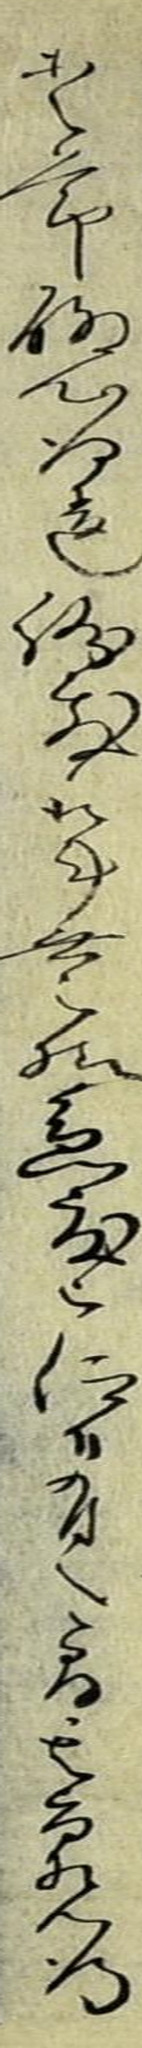等之節聊心得違紛敷取計無之様急度被仰付有之候間其旨相心得
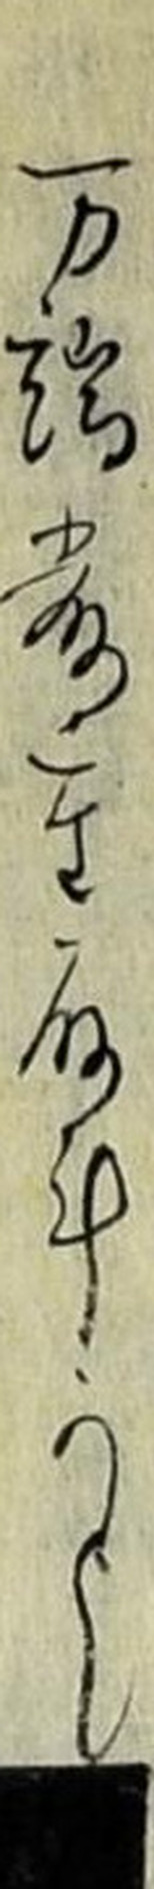万端厳重取計可申候
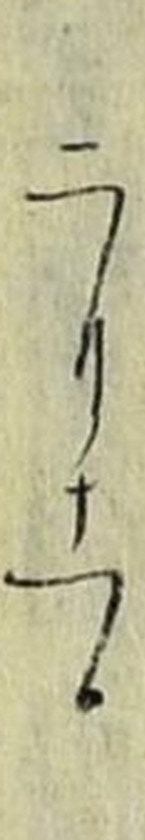二月十一日
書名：命令之部 三
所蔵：福井県文書館 Fukui Prefectural Archives
